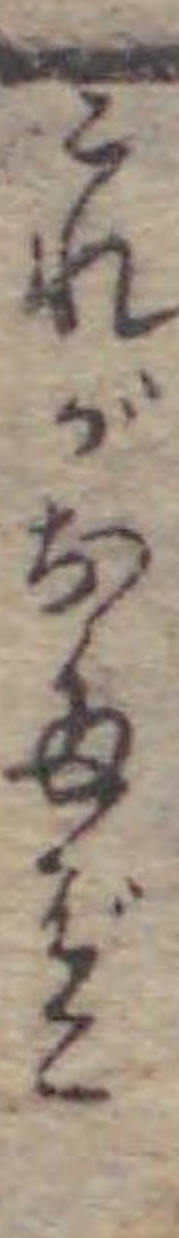これがおたばこ
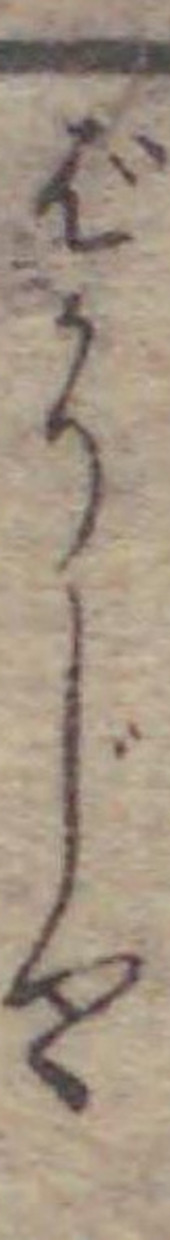ばかりじや

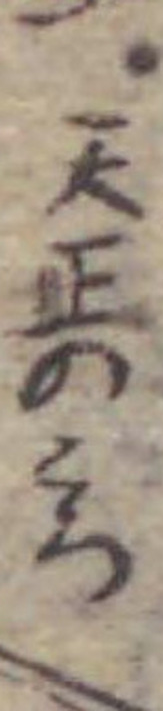天正のころ
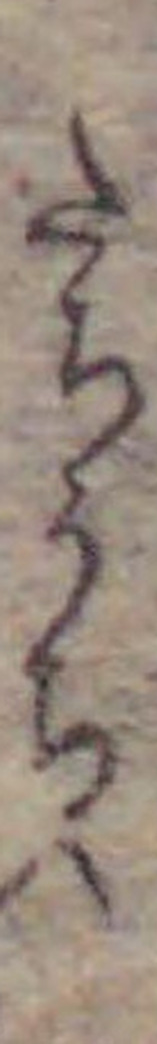たちうちは
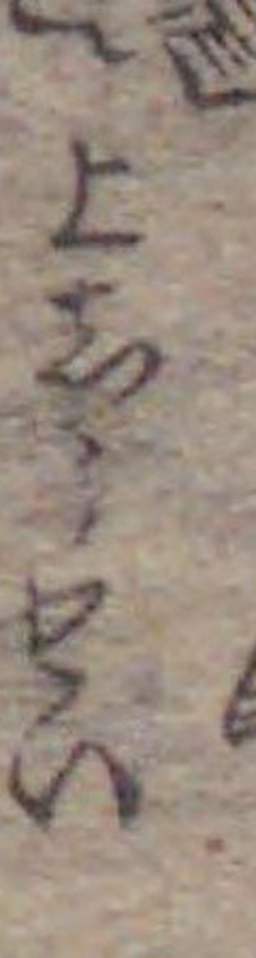上しうせい
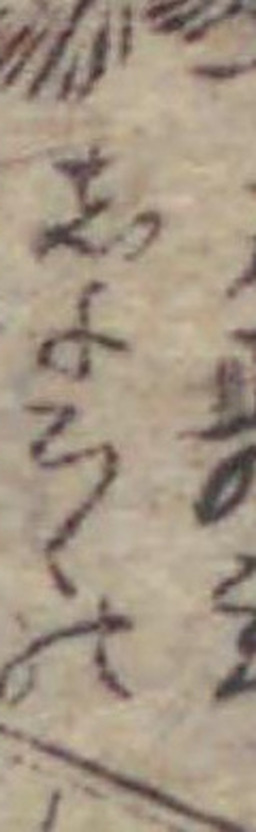しよこくの
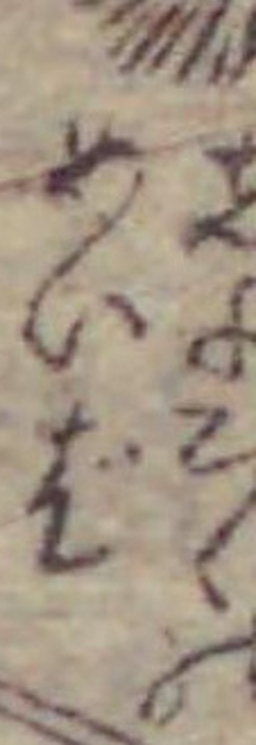めいば
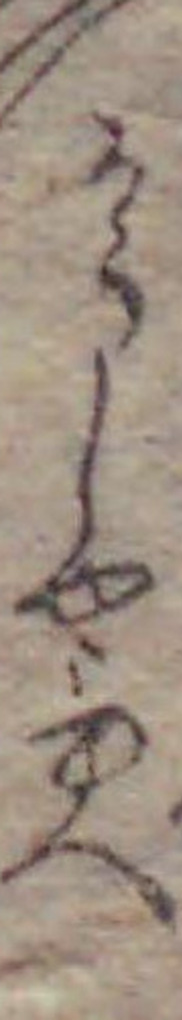かうしやゆへ
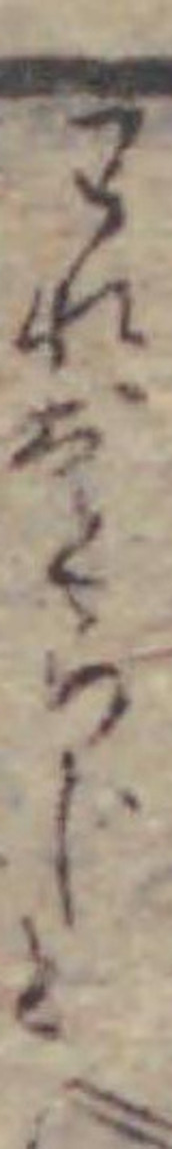われおとらじと
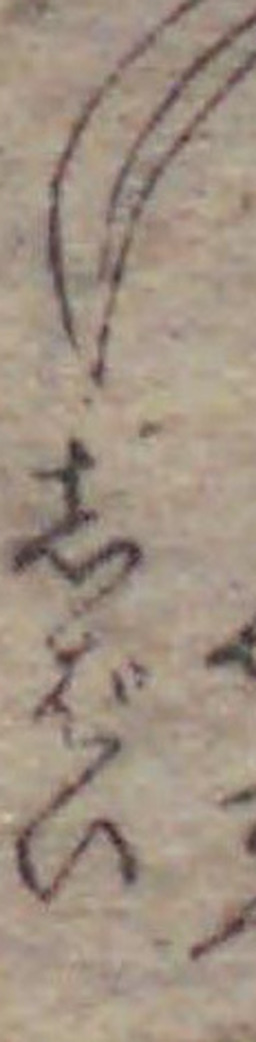しばい
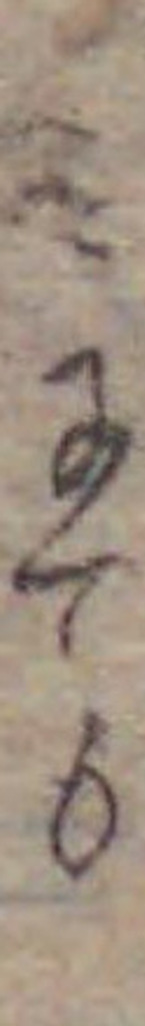にても
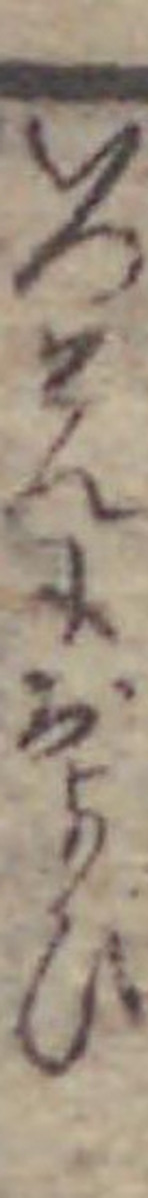いつせんにおよび
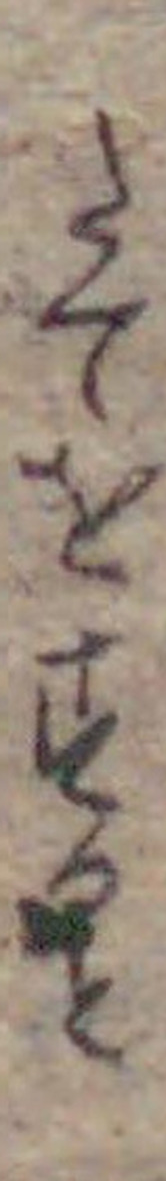たてをすると
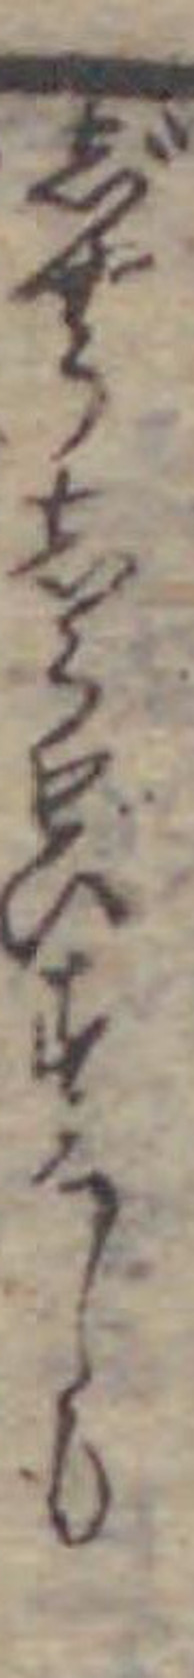じやうしらぜいすくしも
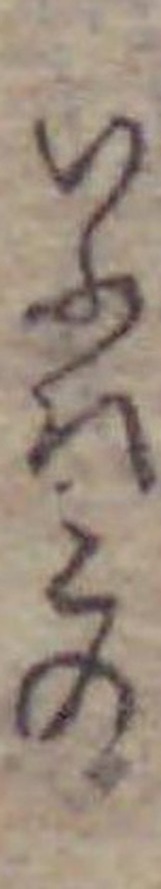いふはこの
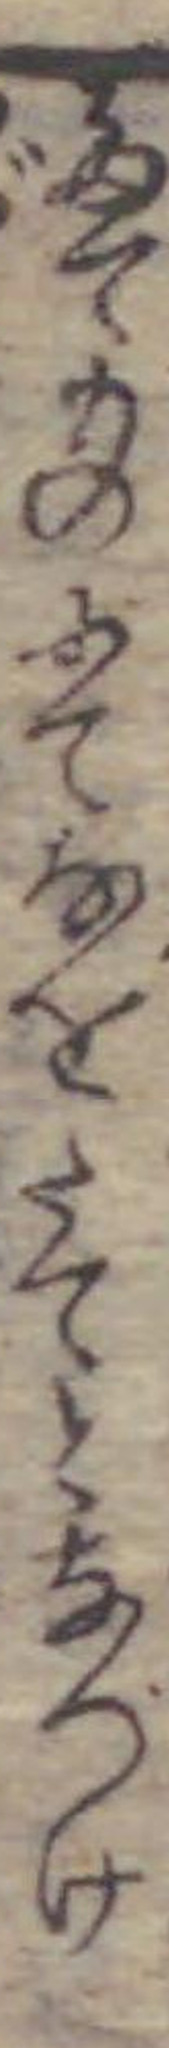たてものにてなをたてとなづけ
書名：談芭菰誉詞 : 3巻
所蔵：国立国会図書館 National Diet Library, JAPAN
